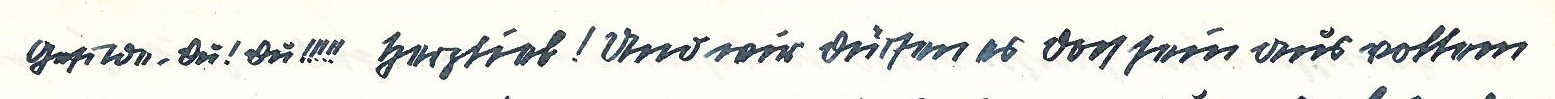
Gefilde, Du! Du!!!!! Herzlieb! Und wir dürfen es doch sein aus vollem
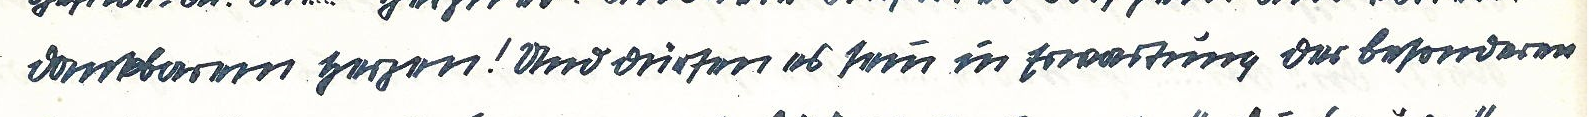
dankbarem Herzen! Und dürfen es sein in Erwartung der besonderen
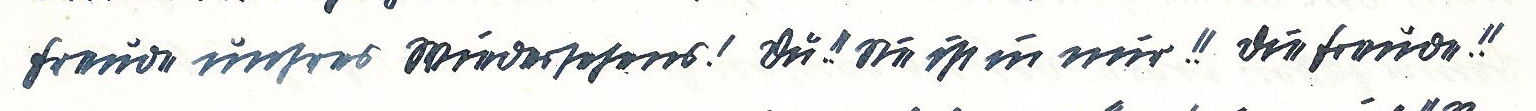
Freude unseres Wiedersehens! Du!! Sie ist in mir!! Die Freude!!
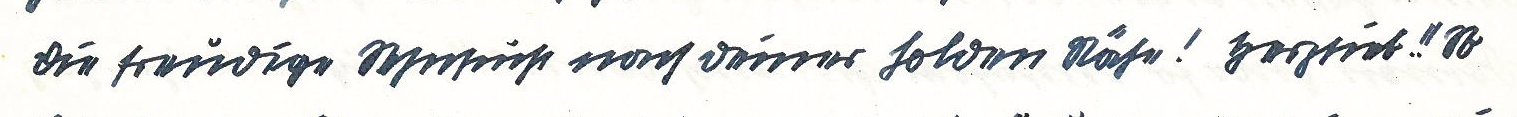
Die freudige Sehnsucht nach Deiner holden Nähe! Herzlieb!! So
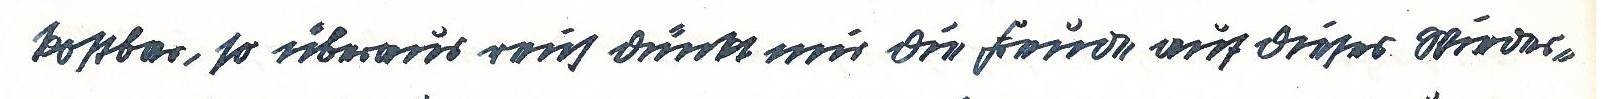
kostbar, so überaus reich dünkt mir die Freude auf dieses Wieder¬
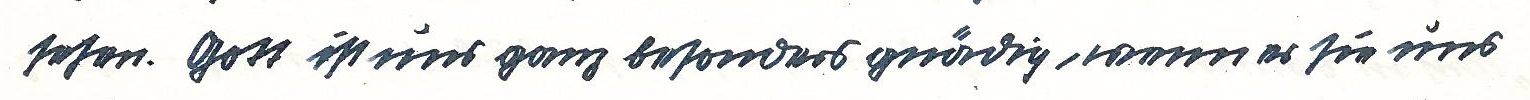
sehen. Gott ist uns ganz besonders gnädig, wenn er sie uns
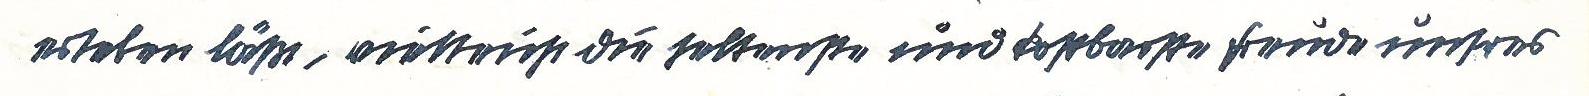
erleben läßt, vielleicht die seltenste und kostbarste Freude unseres
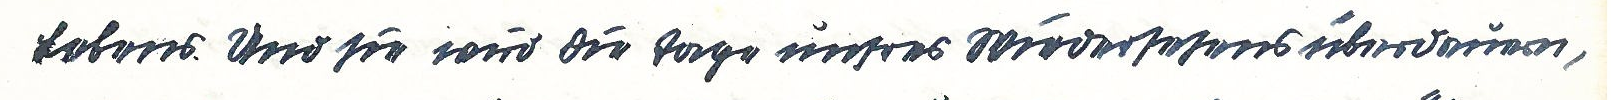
Lebens. Und sie wird die Tage unsres Wiedersehens überdauern,
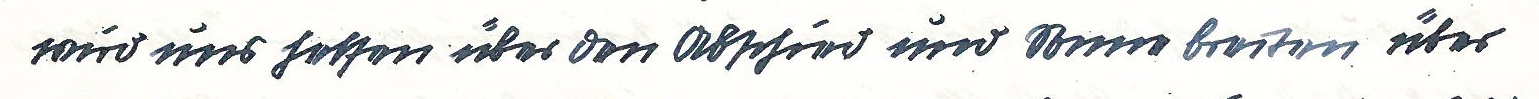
wird uns helfen über den Abschied und Sonne breiten über
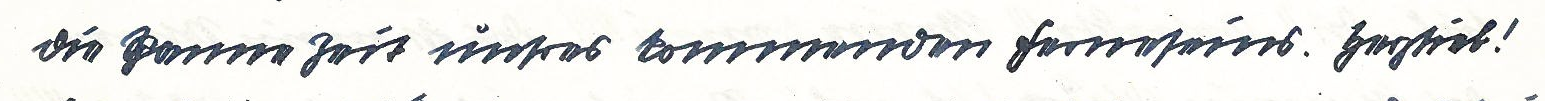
die Spanne Zeit unsres kommenden Ferneseins. Herzlieb!
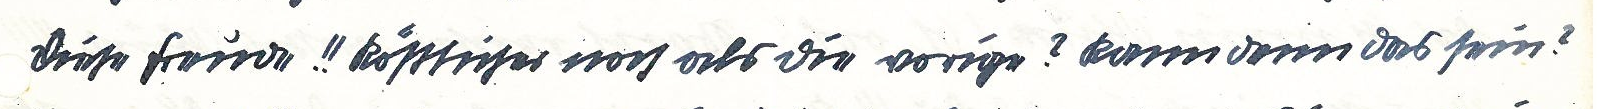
Diese Freude!! Köstlicher noch als die vorige? Kann denn das sein?
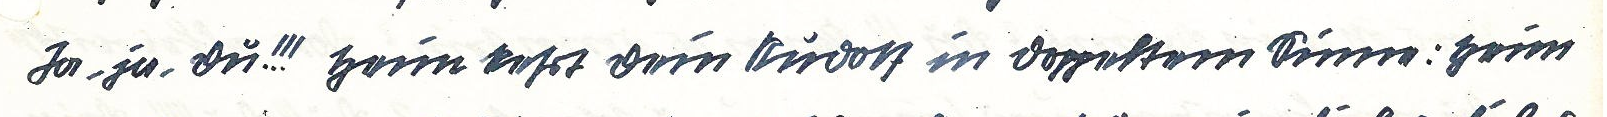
Ja, ja, Du!!! Heim kehrt Dein Rudolf in doppeltem Sinne: Heim
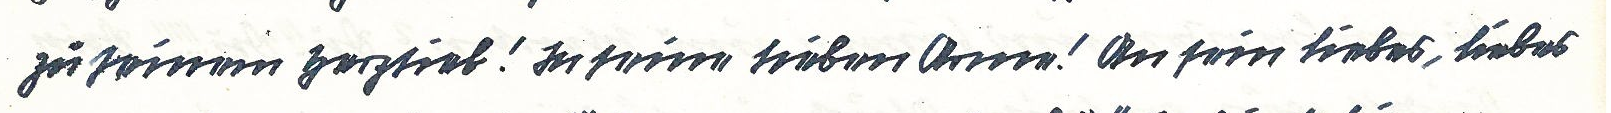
zu seinem Herzlieb! In seine lieben Arme! An sein liebes, liebes
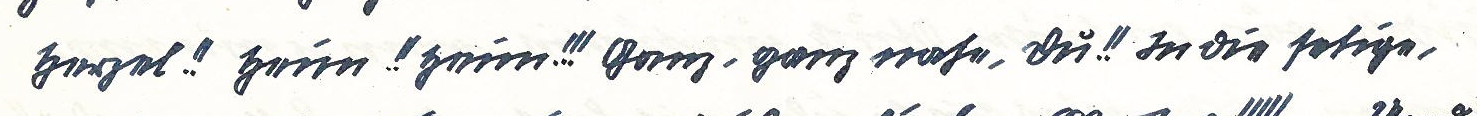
Herzel!! Heim!! Heim!!! Ganz, ganz nahe, Du!! In die selige,
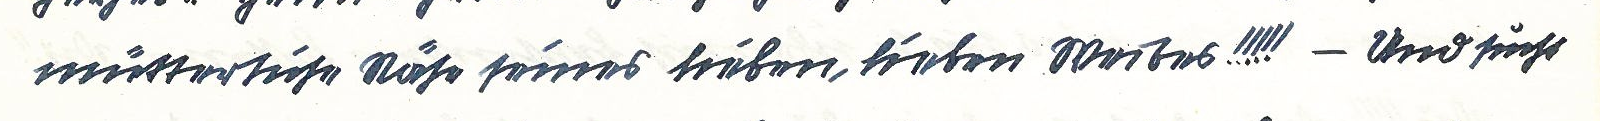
mütterliche Nähe seines lieben, lieben Weibes!!!!! – Und sucht
